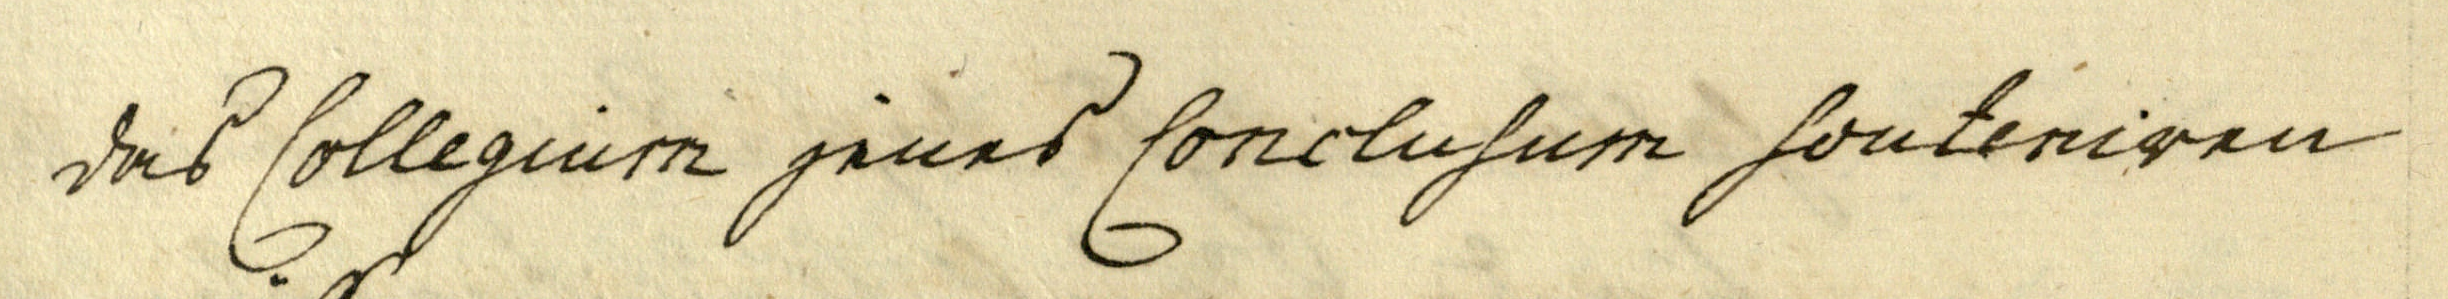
das Collegium jenes Conclusum souteniren
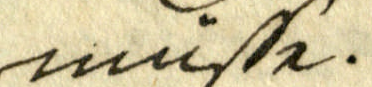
müsse.
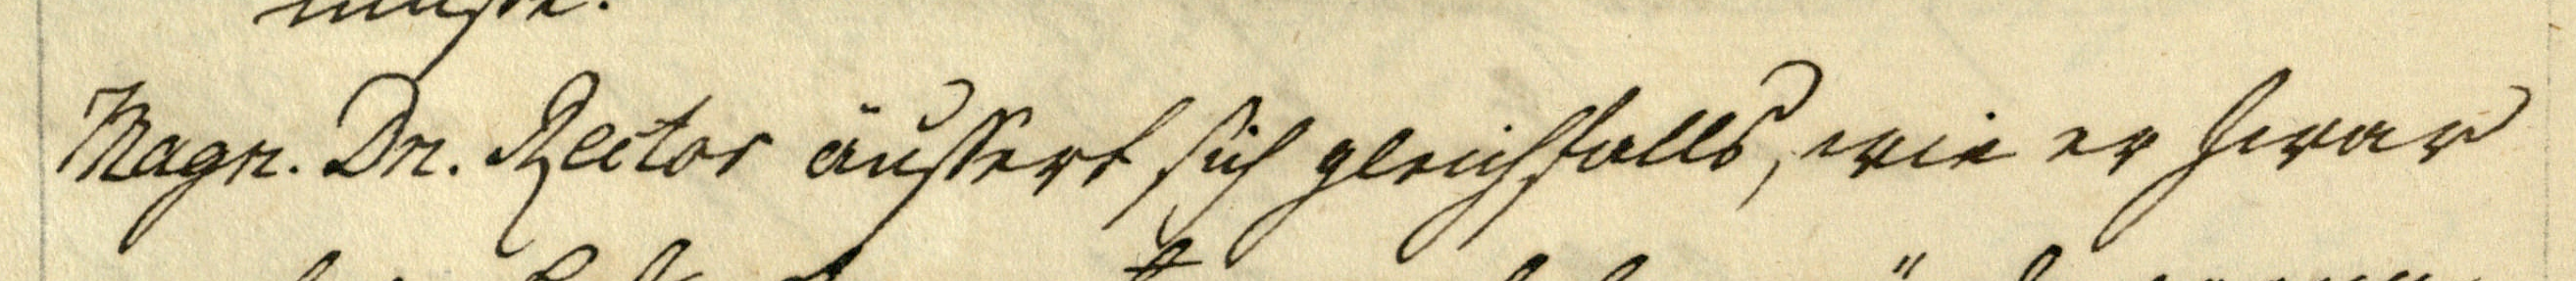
Magn. Dn. Rector äussert sich gleichfalls, wie er zwar
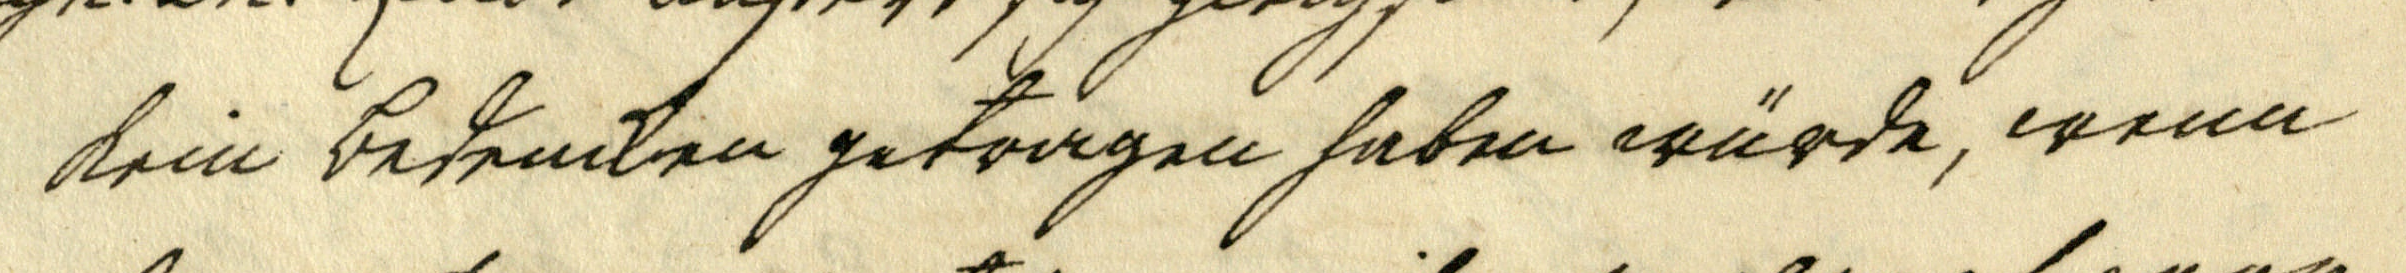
kein Bedencken getragen haben würde, wenn
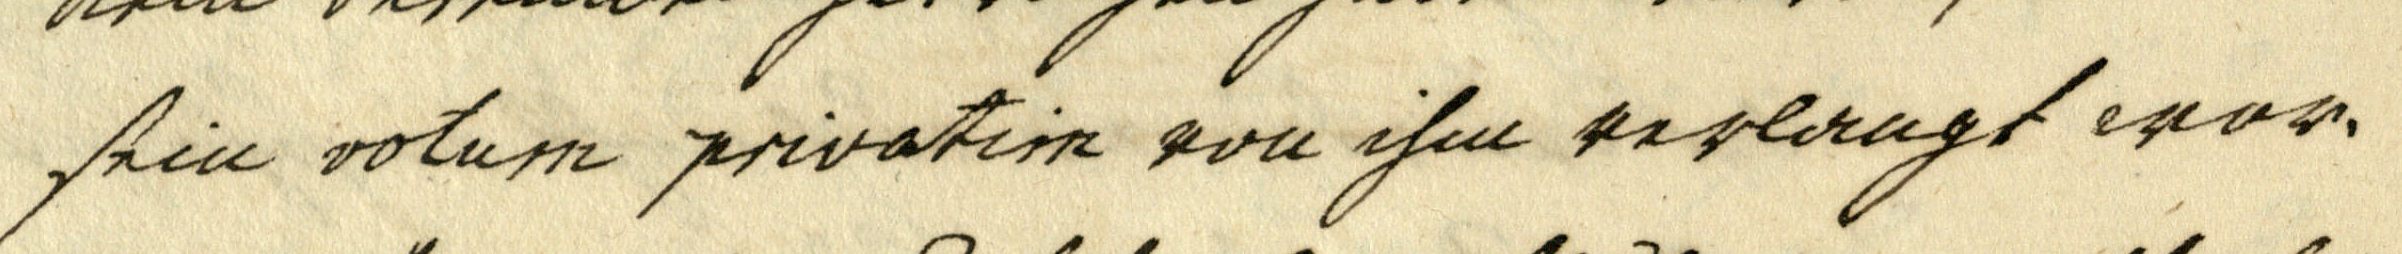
sein votum privatim von ihm verlangt wor¬
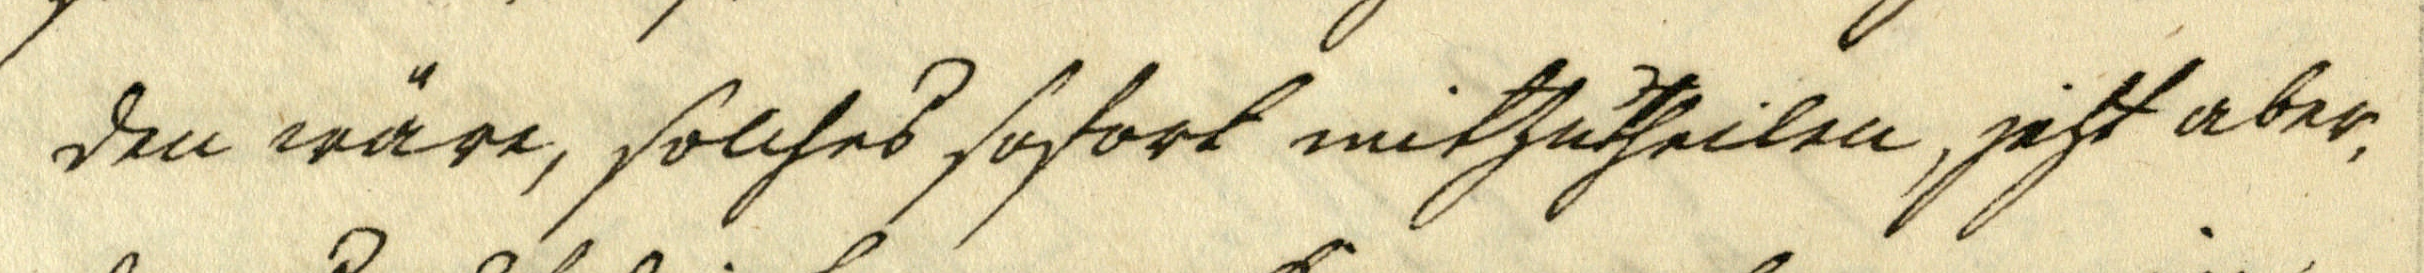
den wäre, solches sofort mitzutheilen, jetzt aber,
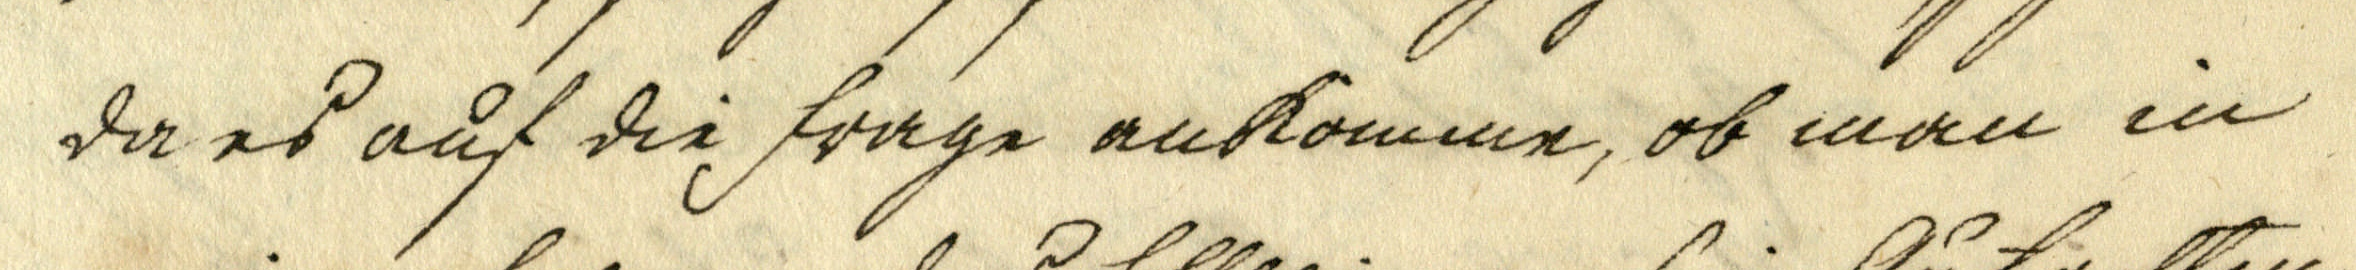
da es auf die Frage ankomme, ob man in
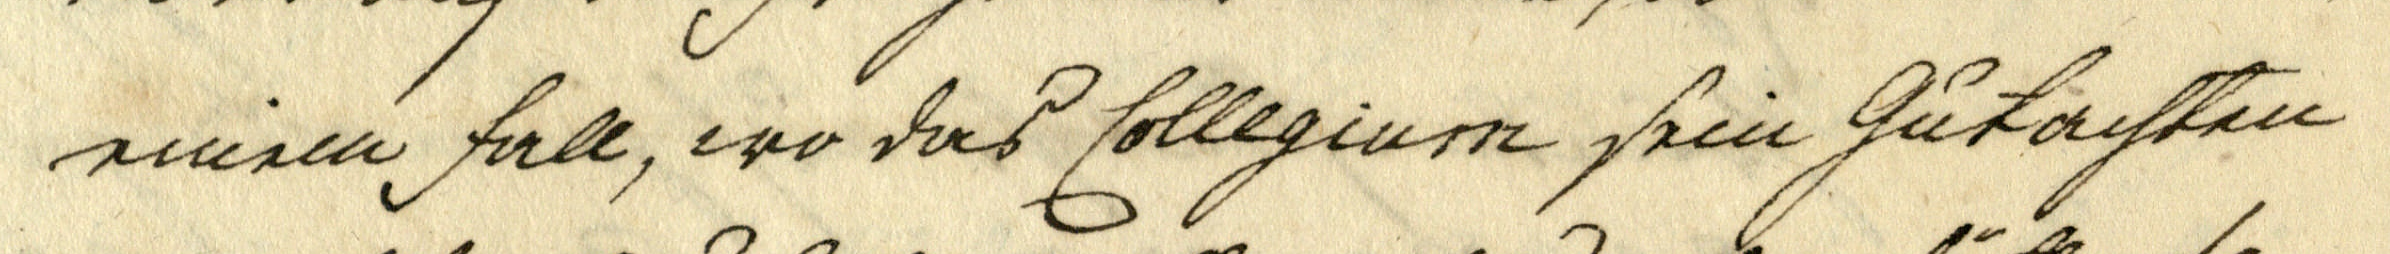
einem Fall, wo das Collegium sein Gutachten
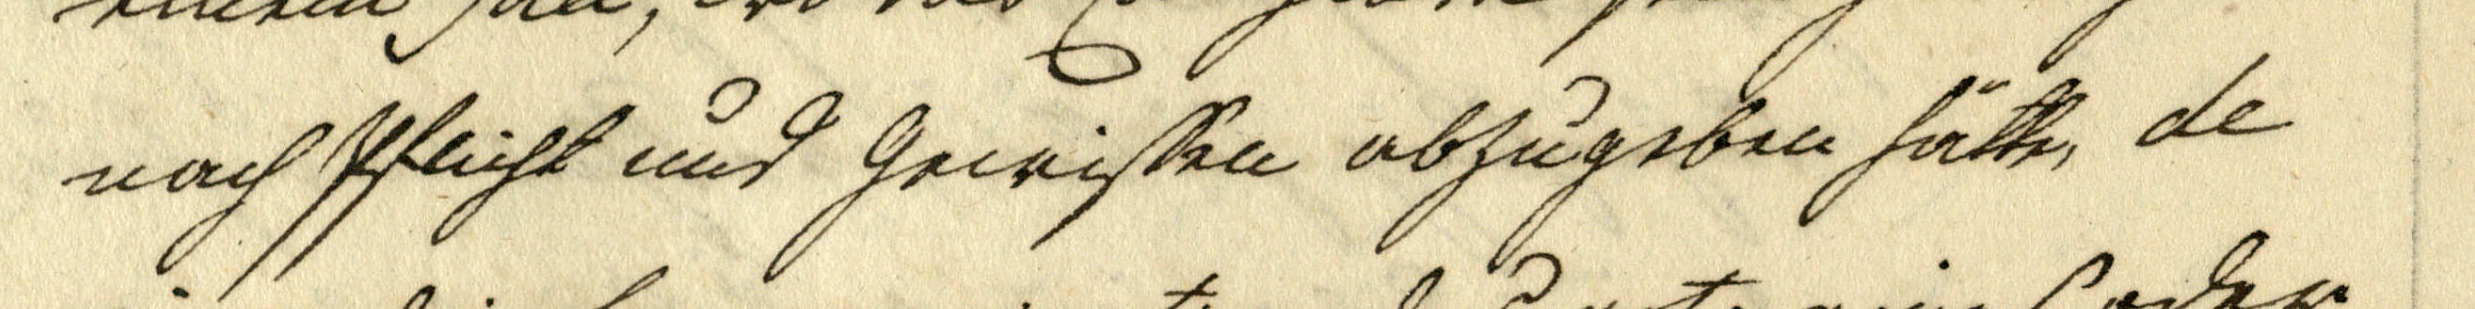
nach Pflicht und Gewissen abzugeben hätte, de
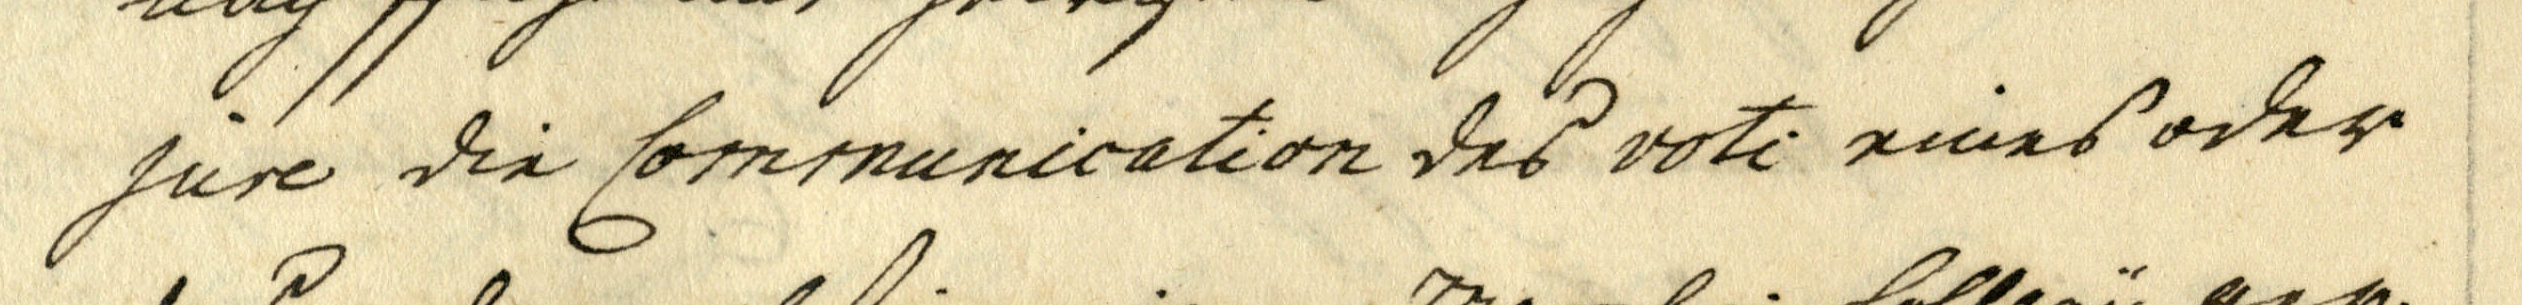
jure die Communication des voti eines oder
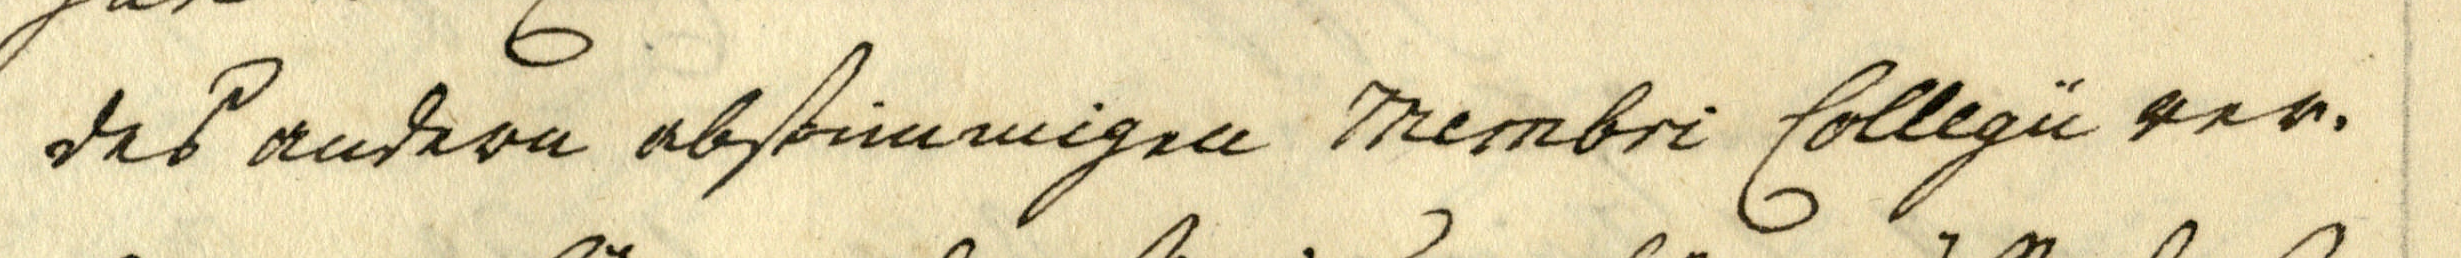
des andern abstimmigen Membri Collegii ver¬
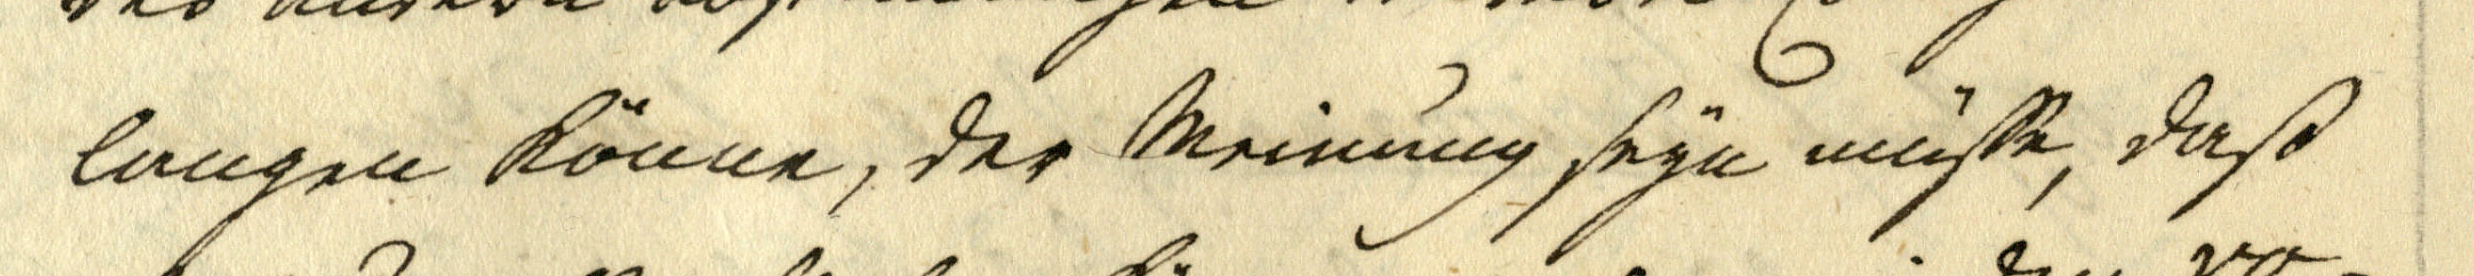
langen könne, der Meinung seÿn müsse, daß
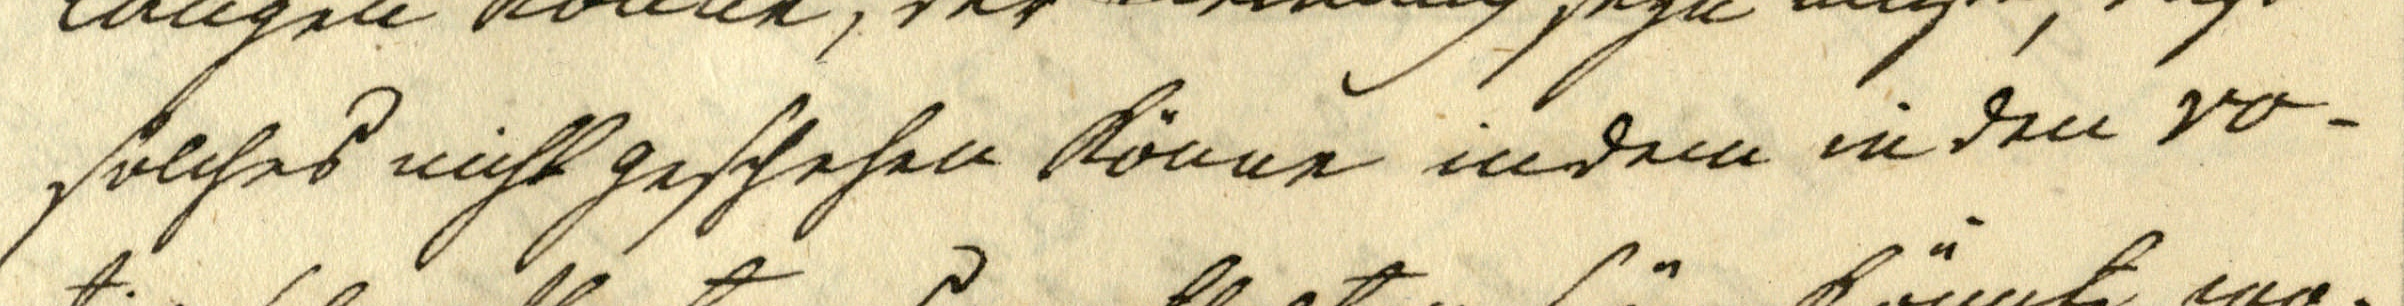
solches nicht geschehen könne indem in den vo¬
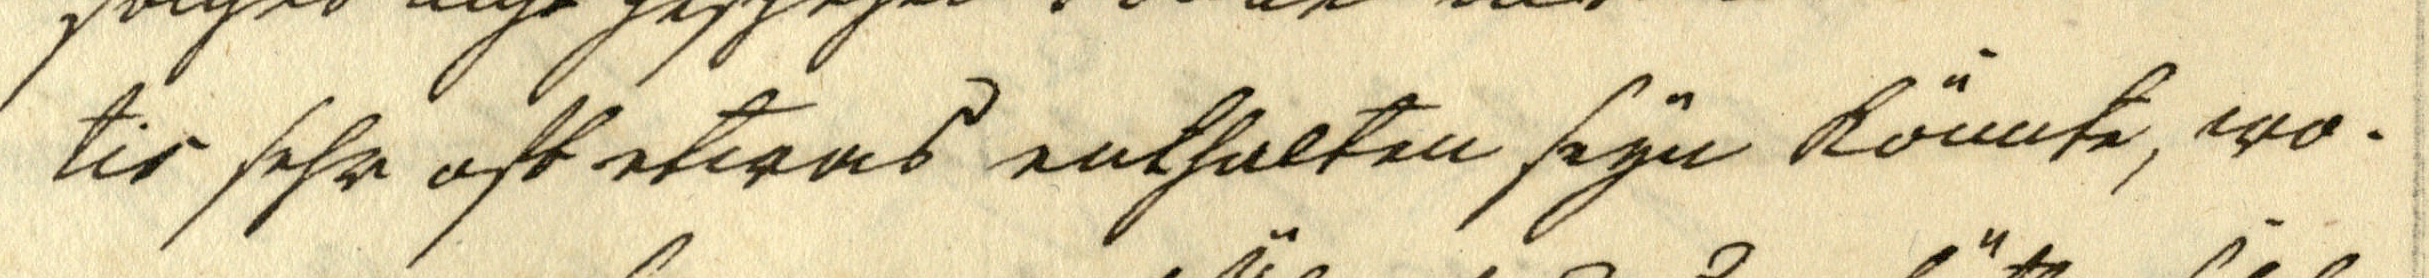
tis sehr oft etwas enthalten seÿn könnte, wo¬
